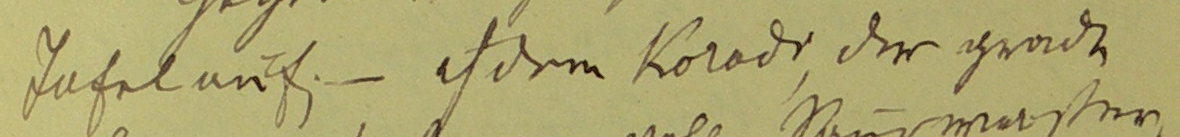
Tafel auf,- f dem ??? , der grade
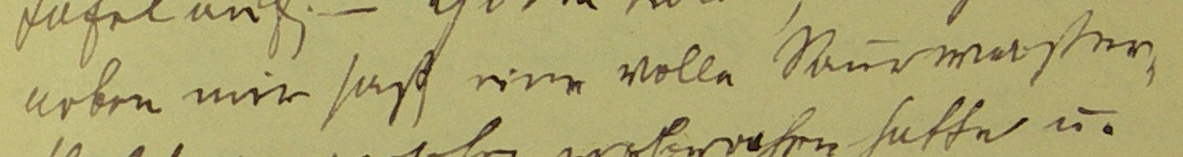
neben mir saß, eine volle Sauerwasser¬
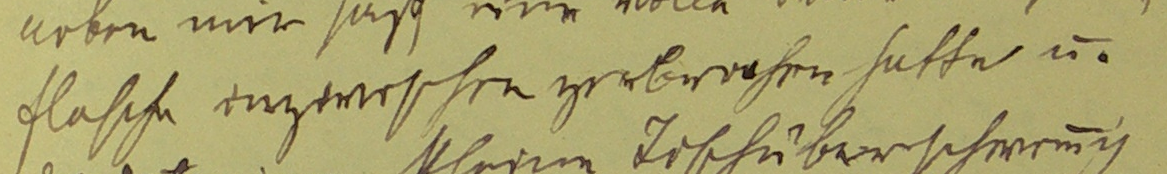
flasche inzwischen zerbrochen hatte u.
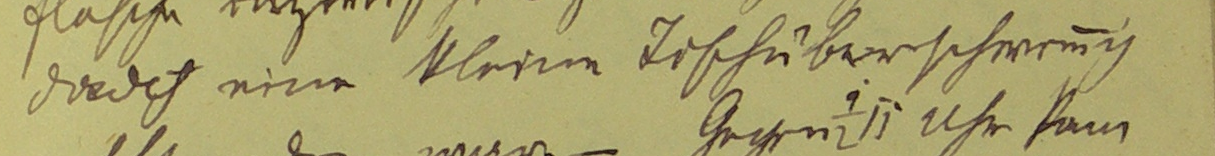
dadch eine kleine Tischüberschwemmung
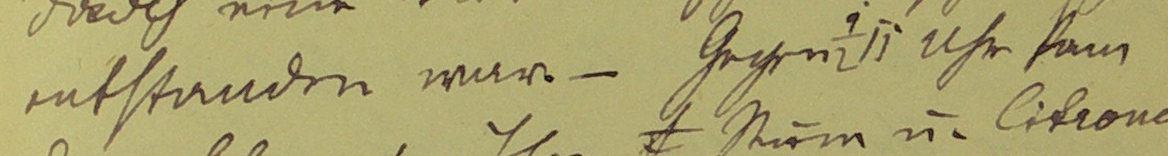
entstanden war.- Gegen ½ 11 Uhr kam
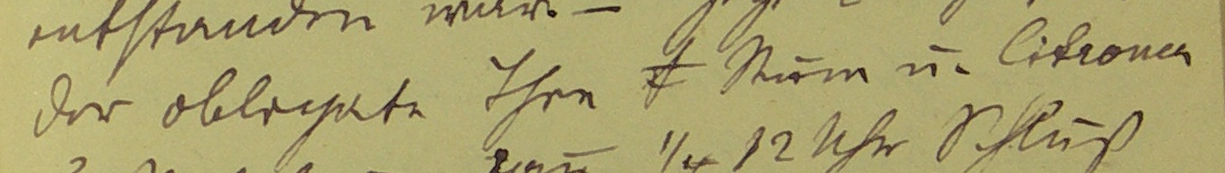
der der obligate Thee t Rum u. ???
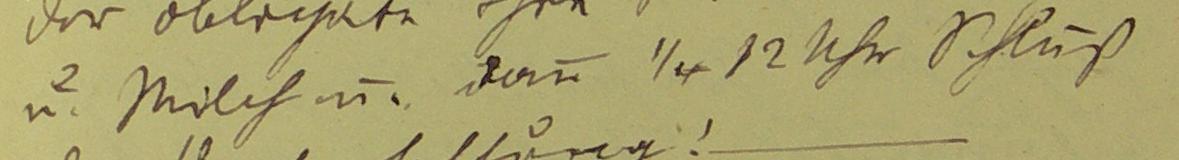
u. Milch u. dann ¼ 12 Uhr Schluß
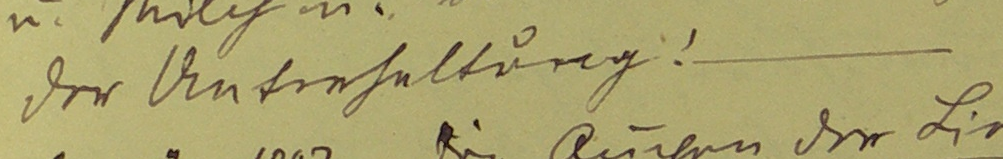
der Unterhaltung !.—
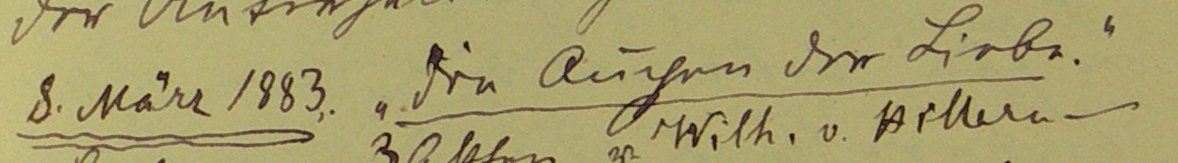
8. ??? 1883 „Die Augen der Liebe.“
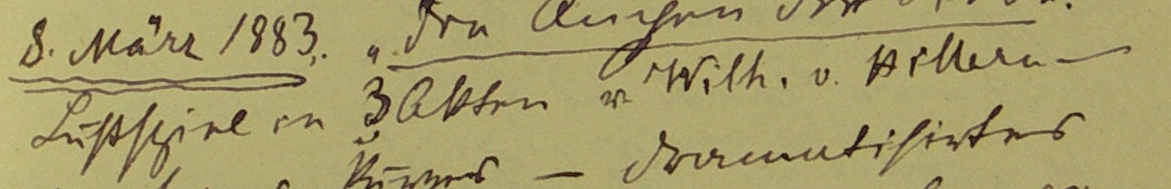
Lustspiel in 3 Akten von ???.v. ??? --
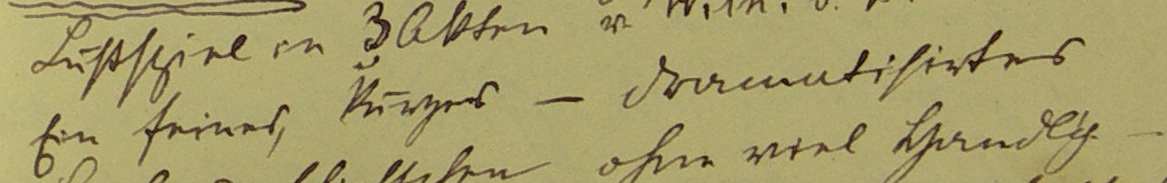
Ein feines, kurzes – dramatisiertes
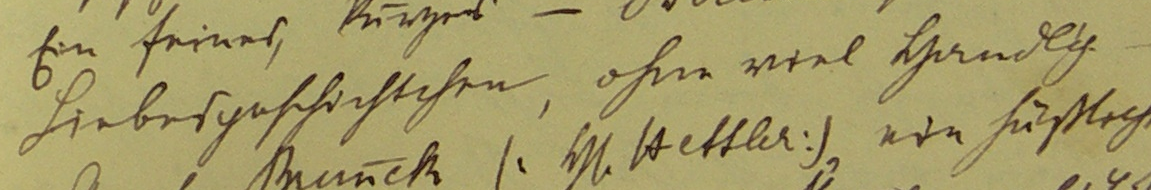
Liebesgeschichtchen, ohne viel Handlg.-
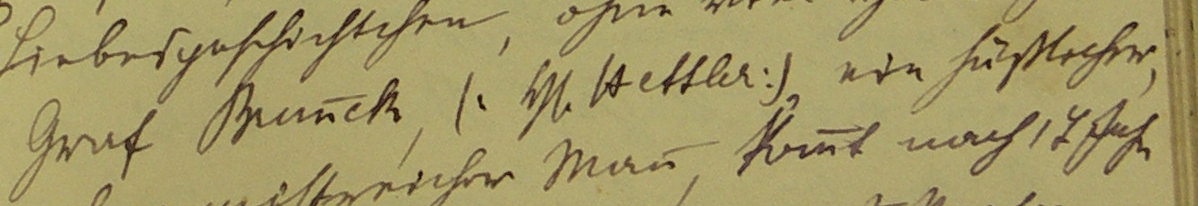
Graf ??? (: H. ??? :) ein häßlicher,
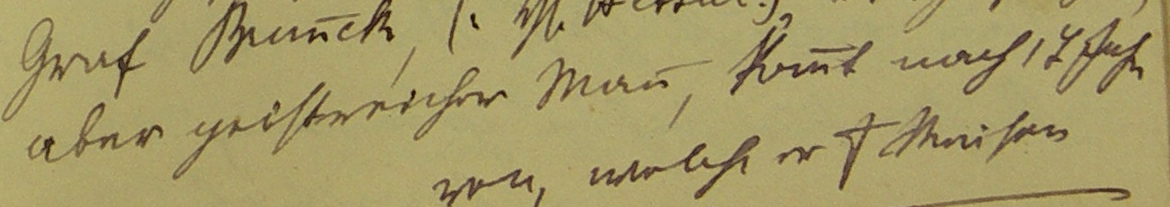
aber geistreicher Mann, kommt nach 17 Jah¬
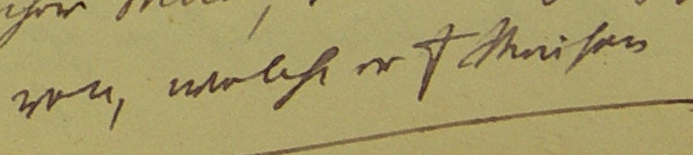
ren, welche er f Reisen
